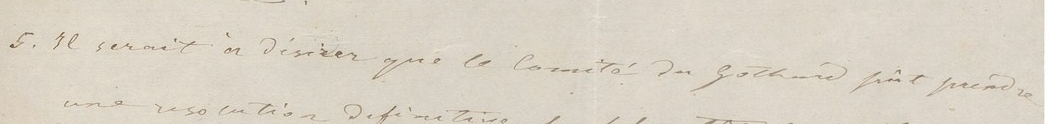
5. Il serait à désirer que le Comité du Gothard pût prendre
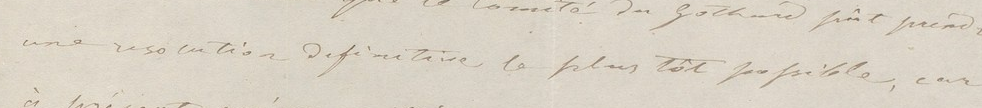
une resolution definitive le plus tôt possible, car
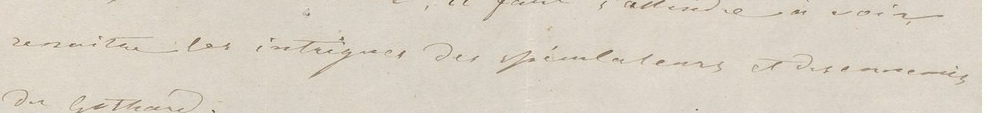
renaitre les intrigues des spéculateurs et des ennemis
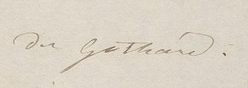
du Gothard.
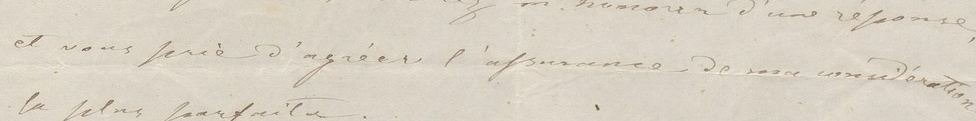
et vous prie d'agréer l'assurance de ma considération
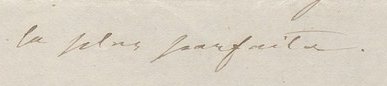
la plus parfaite.
